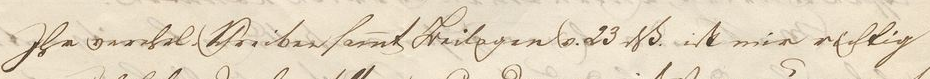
Ihr verehrl. Schreiben sammt Beilagen v. 23 dß. ist mir richtig
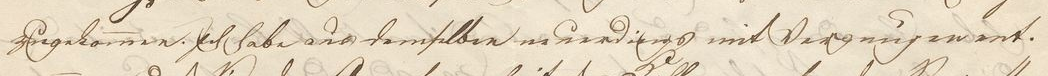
zugekommen. Ich habe aus demselben neuerdings mit Vergnügen ent-
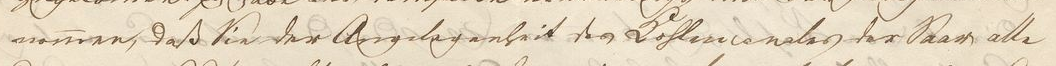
nommen, daß Sie der Angelegenheit des Kohlencanales der Saar alle
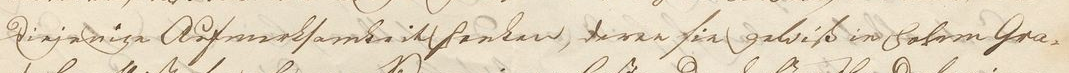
diejenige Aufmerksamkeit schenken, derer sie gewiß in hohem Gra-
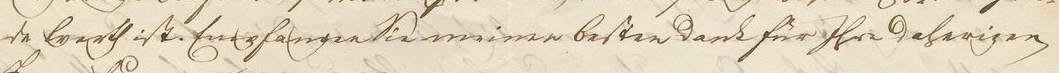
de werth ist. Empfangen Sie meinen besten Dank für Ihre daherigen
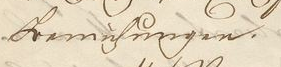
Bemühungen.
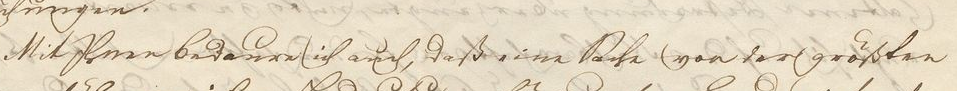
Mit Ihnen bedaure ich auch, daß eine Sache von der größten
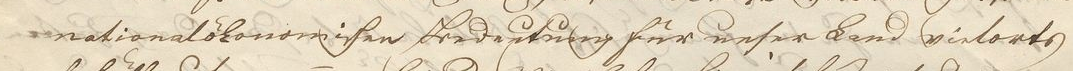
nationalökonomischen Bedeutung für unser Land vielorts
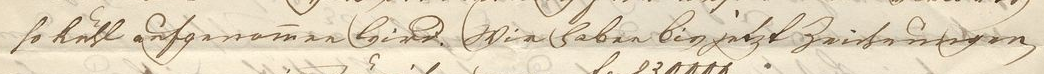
so kühl aufgenommen wird. Wir haben bis jetzt Zeichnungen,
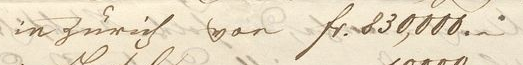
in Zürich vonfr. 830,000.–in
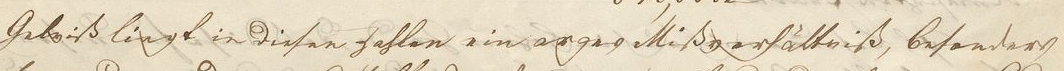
Gewiß liegt in diesen Zahlen ein arges Mißverhältniß, besonders
